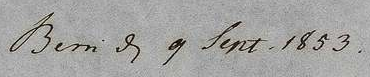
Bern den 9 Sept. 1853.
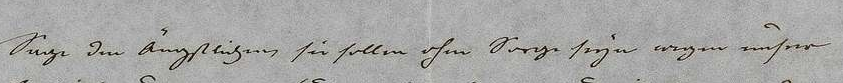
Sage den Ängstlichen, sie sollen ohne Sorge seyn wegen unsrer
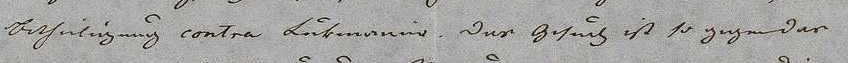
Betheiligung contra Lukmanier. Das Gesuch ist so gegen das
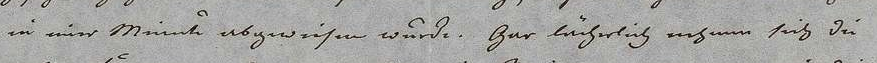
in einer Minute abgewiesen wurde. Gar lächerlich nehmen sich die
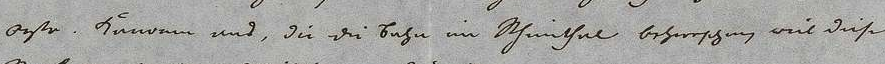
Oestr. Kanonen aus, die die Bahn im Rheinthal beherrschen, weil diese
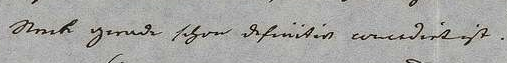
Strecke gerade schon definitiv concedirt ist.
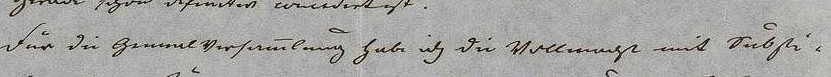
Für die General Versammlung habe ich die Vollmacht mit Substi-
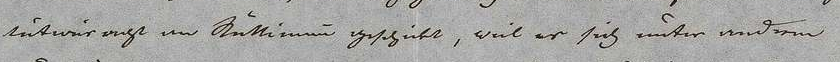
tutionsrecht an Rüttimann geschickt, weil es sich unter anderm
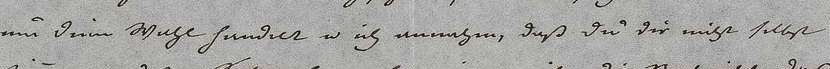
um Deine Wahl handelt u ich annahm, daß Du Dir nicht selbst
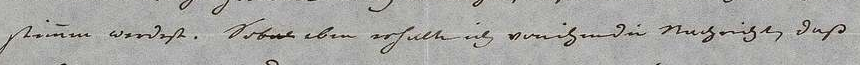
stimmen werdest. So eben erhalte ich von ihm die Nachricht, daß
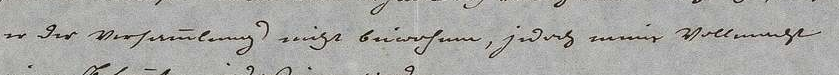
er der Versammlung nicht beiwohnen, jedoch meine Vollmacht
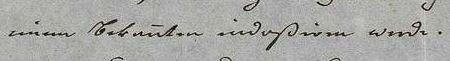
einem Bekannten indoßiren werde.
